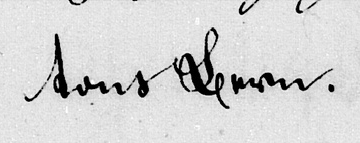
tons Bern.
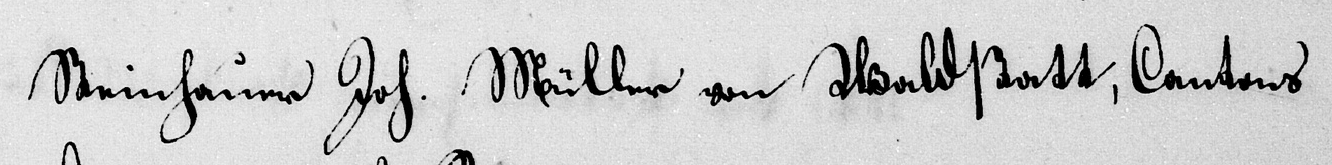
Steinhauer Joh. Müller von Waldstatt, Cantons
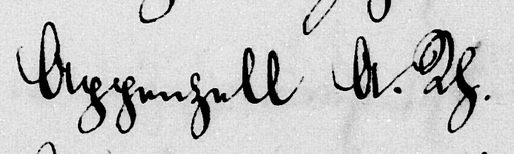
Appenzell A. Rh.
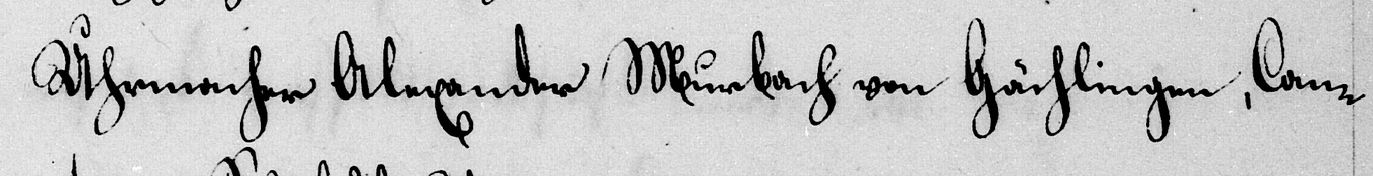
Uhrmacher Alexander Murbach von Gächlingen, Can¬
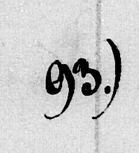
93.)
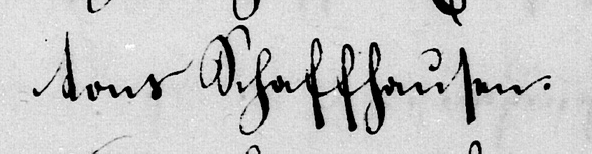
tons Schaffhausen.
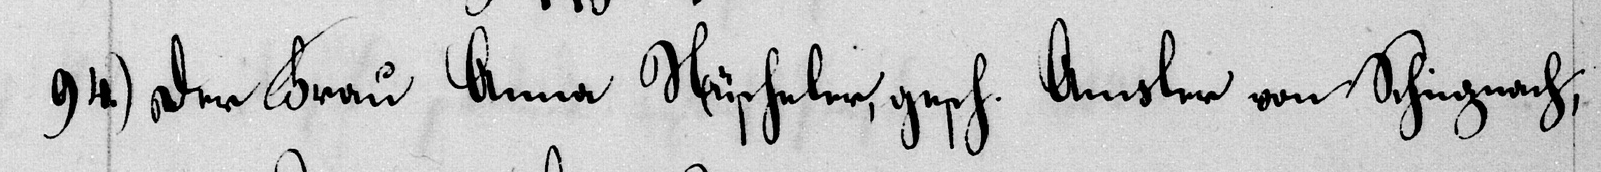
94.) Der Frau Anna Nüscheler, gesch. Amsler von Schinznach,
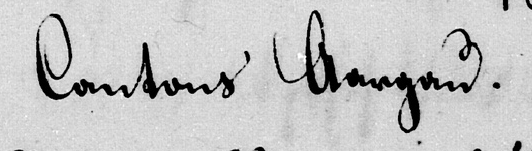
Cantons Aargau.
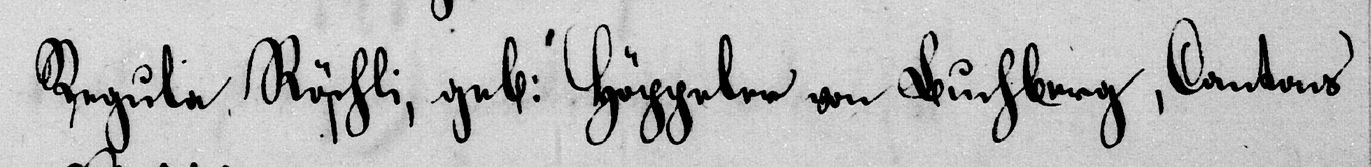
Regula Röschli, geb: Höppeler von Buchberg, Cantons
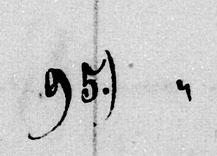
95.)
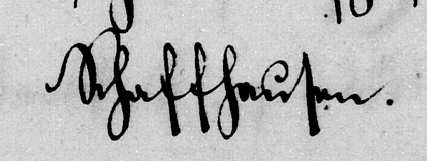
Schaffhausen.
